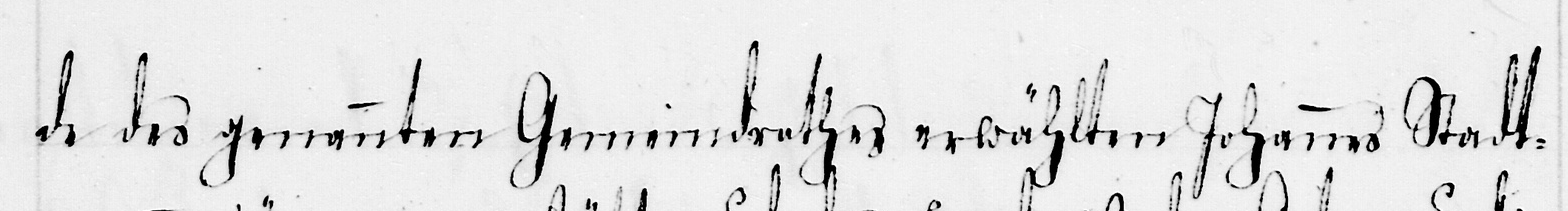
de des genannten Gemeindrathes erwählten Johannes Stadt¬
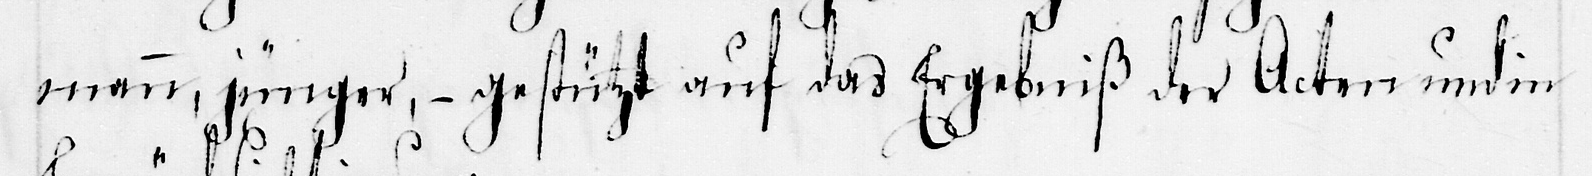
mann, jünger, – gestützt auf das Ergebniß der Acten und in
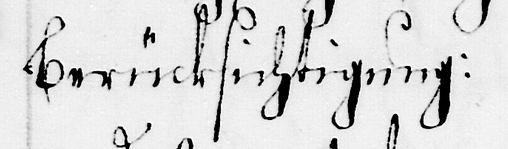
Berücksichtigung:
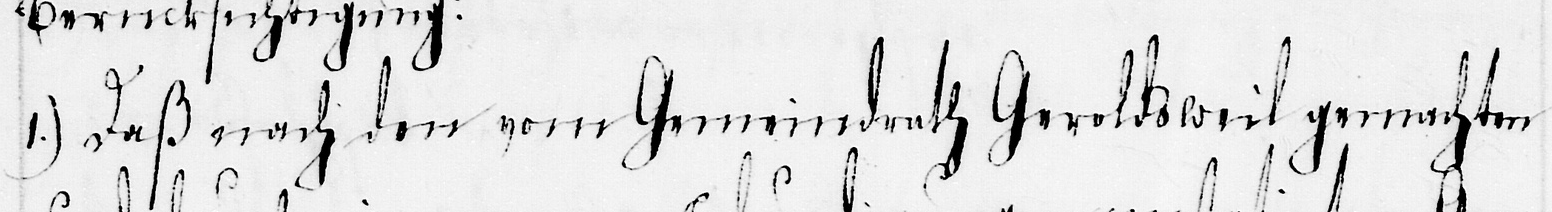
1.) Daß nach den vom Gemeindrath Geroldsweil gemachten
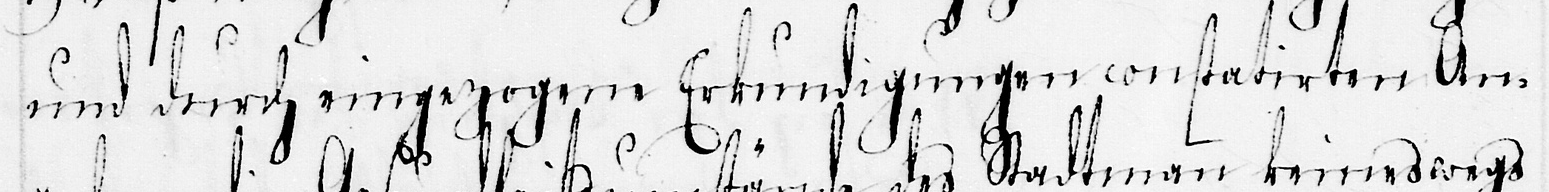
und durch eingezogene Erkundigungen constatirten An¬
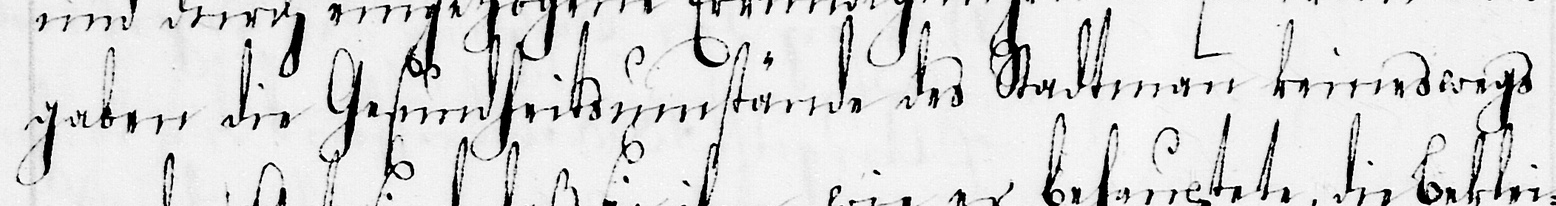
gaben die Gesundheitsumstände des Stadtmann keineswegs
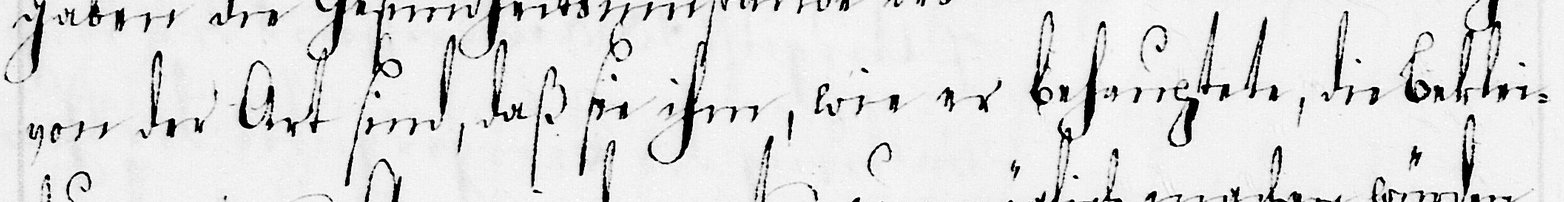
von der Art sind, daß sie ihm, wie er behauptete, die Beklei¬
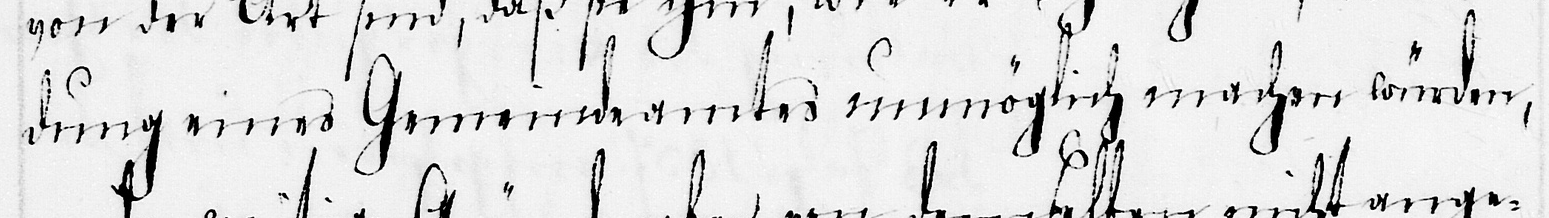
dung eines Gemeindeamtes unmöglich machen würden,
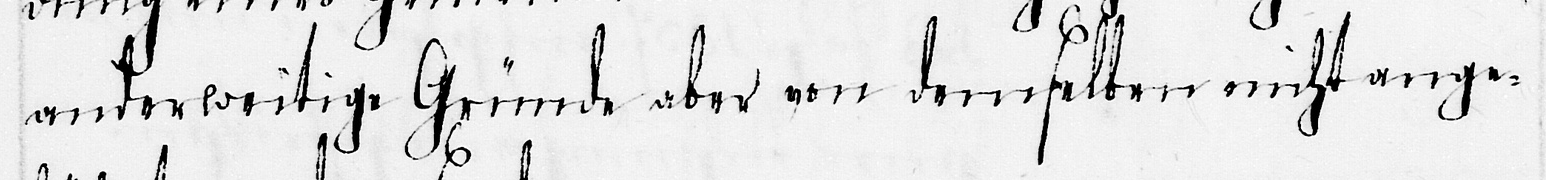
anderweitige Gründe aber von demselben nicht ange¬
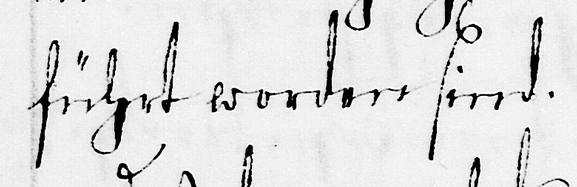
führt worden sind.
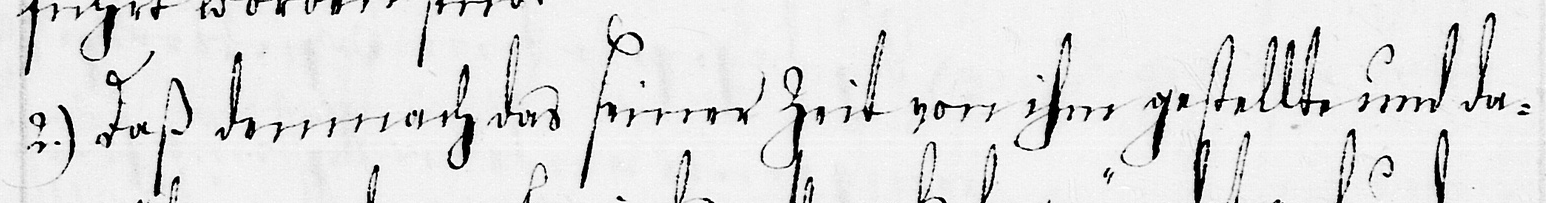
2.) Daß demnach das seiner Zeit von ihm gestellte und da¬
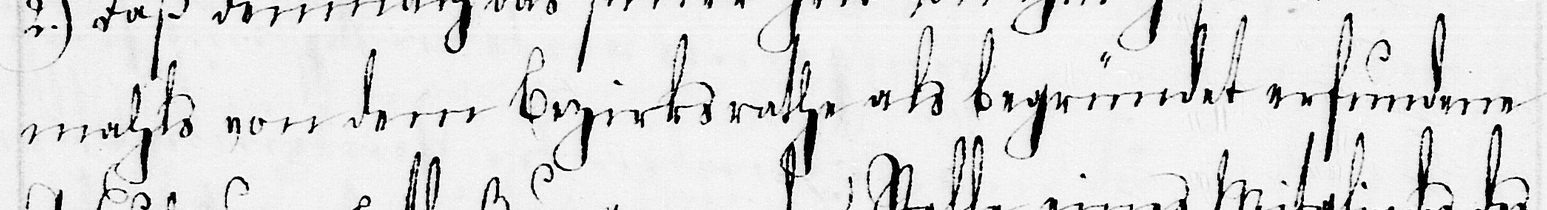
mahls von dem Bezirksrathe als begründet erfundene
